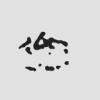{行率}
